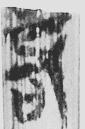寺
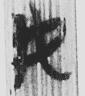四
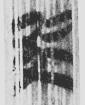{吅文}（鄰）
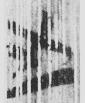之
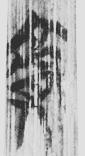賓
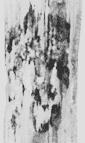{宀人各}（客）
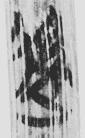後
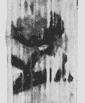之
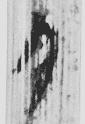人
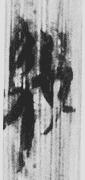幾
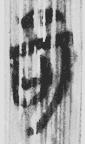可
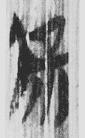保
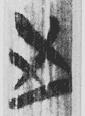之
